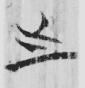之
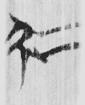𡰥
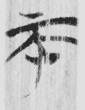帀
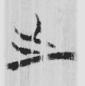之
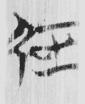佢
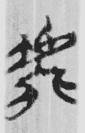鹿
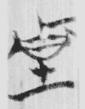{卜？土}
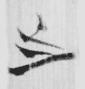之
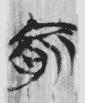俞
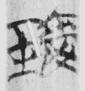{王爾}
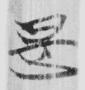是
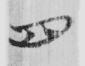四
